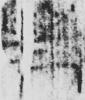爲
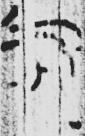宔（主）
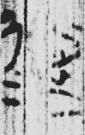道
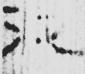四
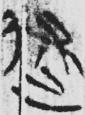述（术）
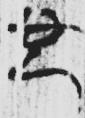也
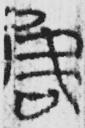唯
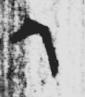人
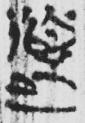道
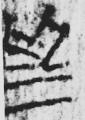爲
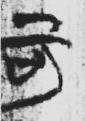可
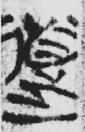道
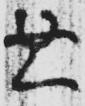也
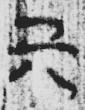亓（其）
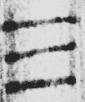三
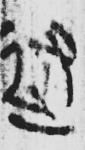述（术）
